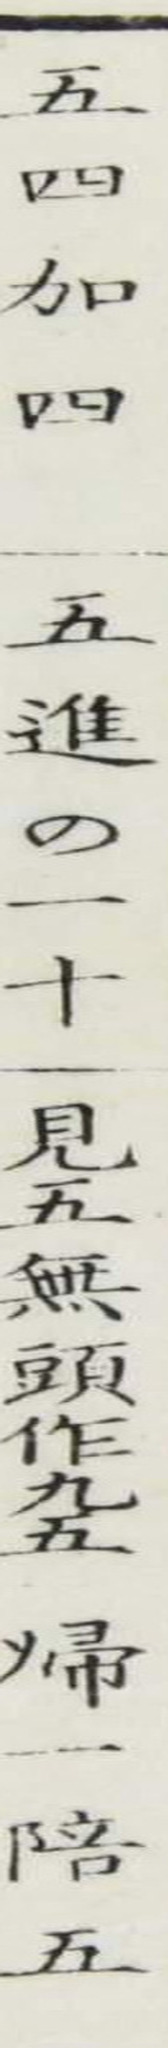五四加四五進の一十見五無頭作九五帰一陪五
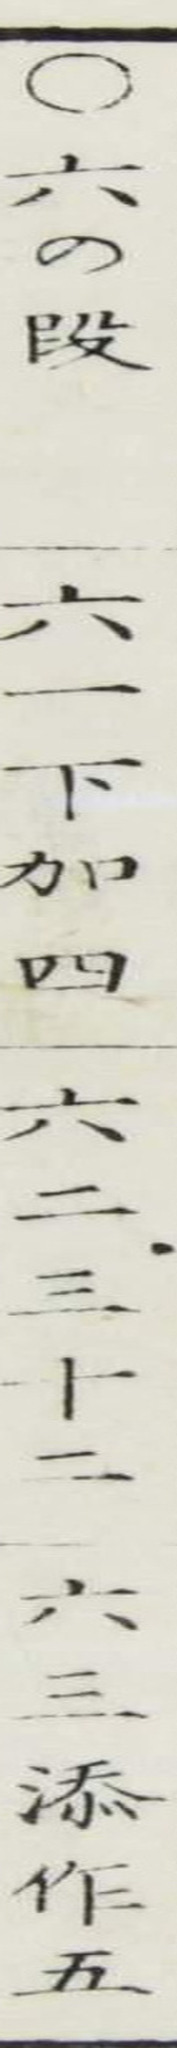○六の段六一下加四六二．三十二六三添作五
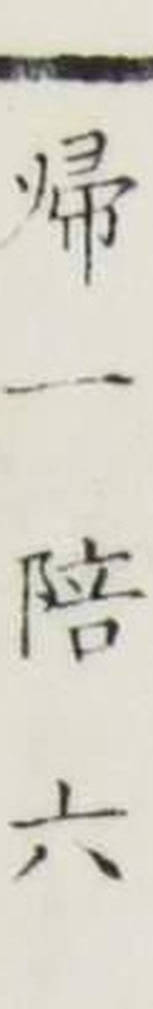帰一陪六
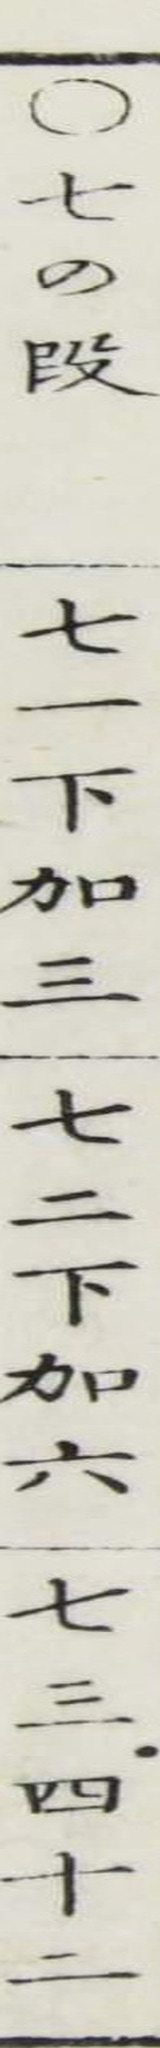○七の段七一下加三七二下加六七三．四十二
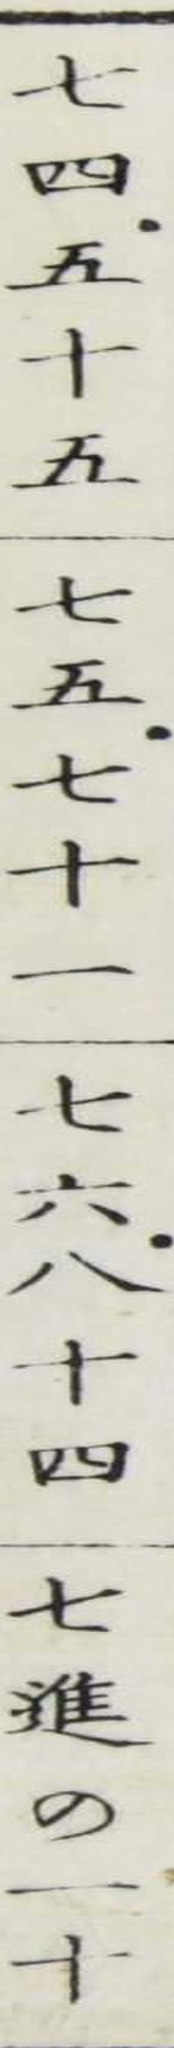七四．五十五七五．七十一七六．八十四七進の一十
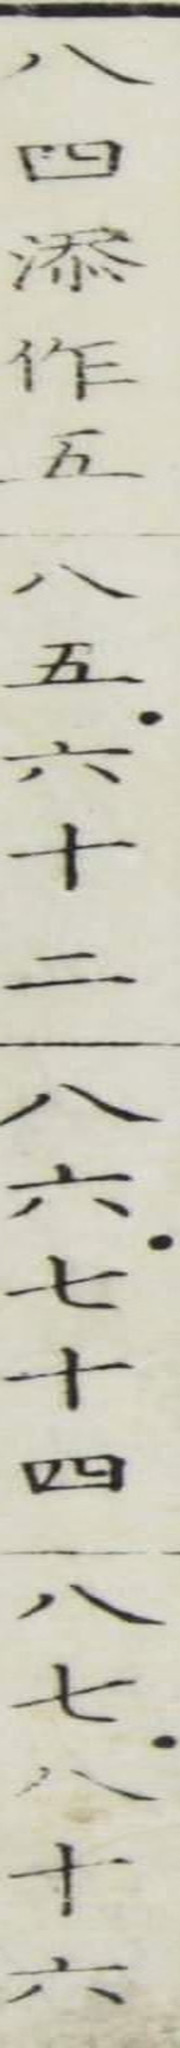八四添作五八五．六十二八六．七十四八七．八十六

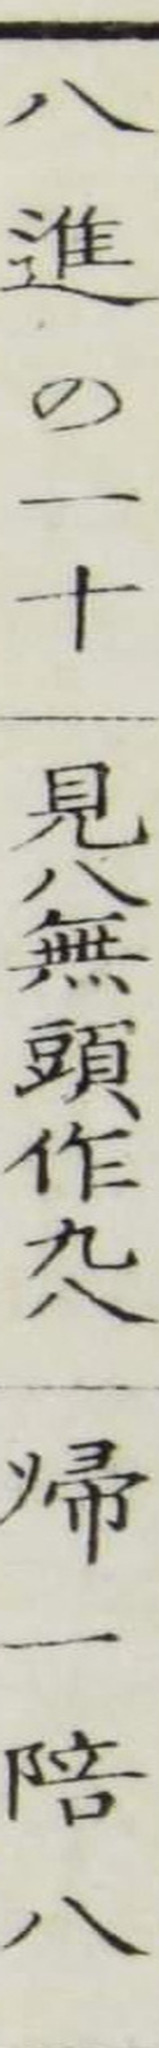八進の一十見八無頭作九八帰一陪八
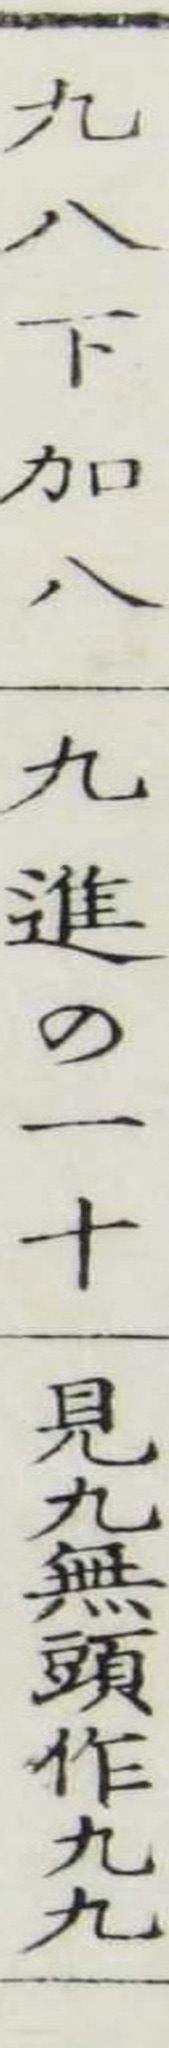九八下加八九進の一十見九無頭作九九
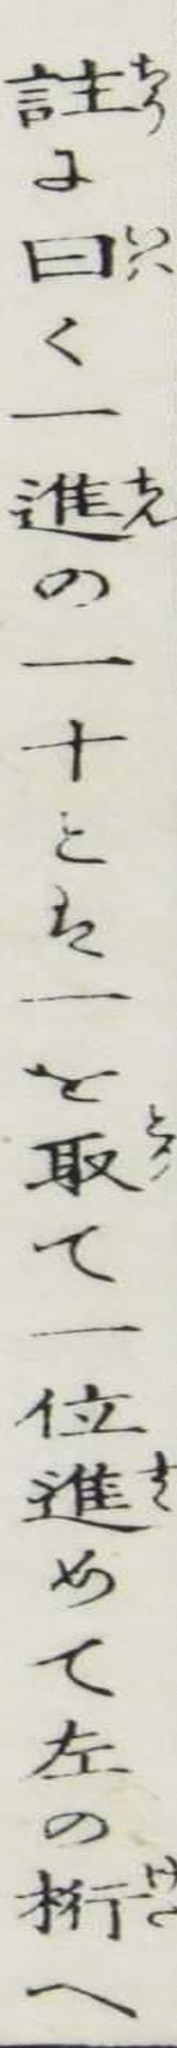註に曰く一進の一十とは一を取て一位進めて左の桁へ
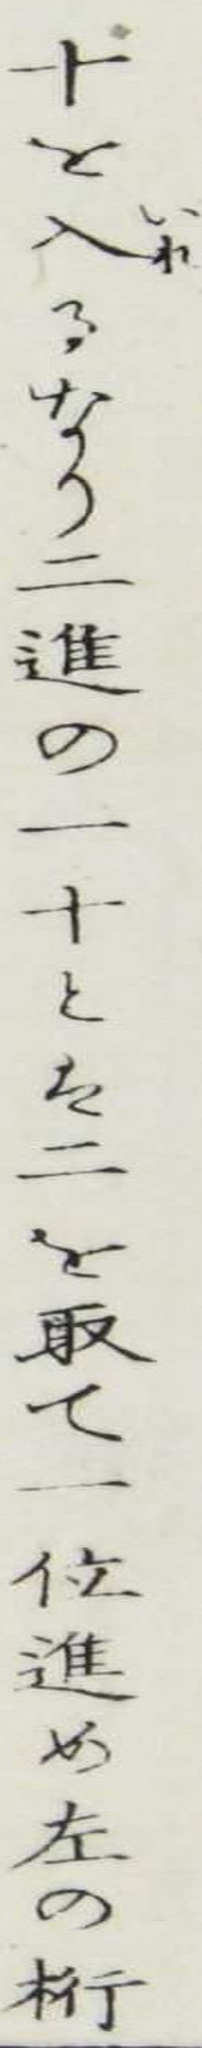十を入るなり二進の一十とは二を取て一位進め左の桁
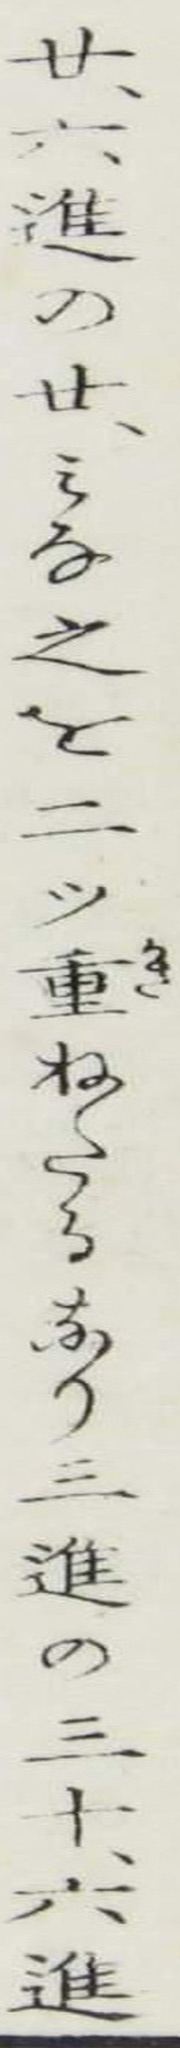廿、六進の廿、みな之を二ッ重ねたるなり三進の三十、六進
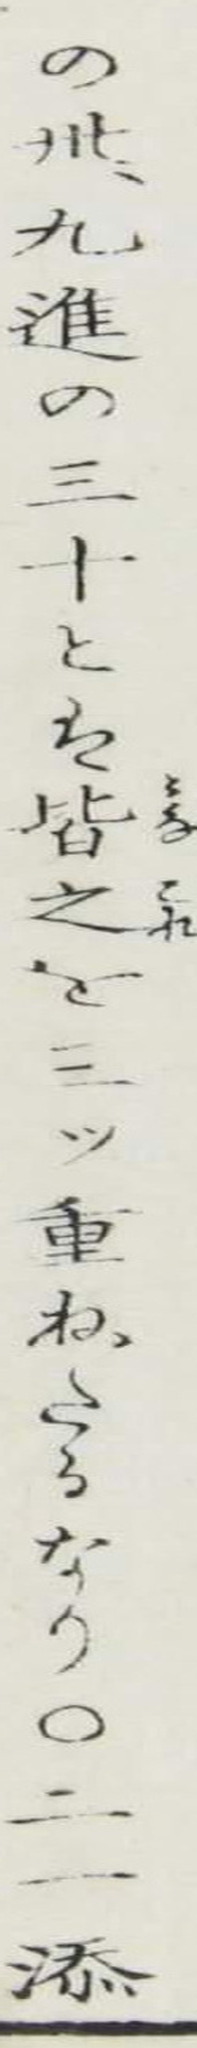の丗、九進の三十とは皆之を三ッ重ねたるなり○二一添
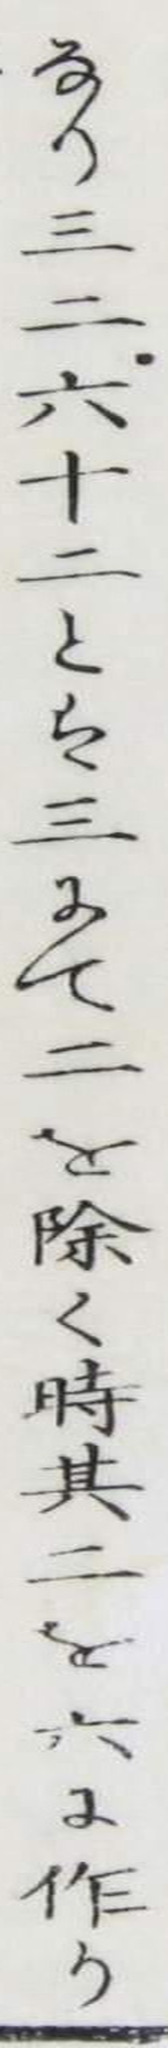なり三二．六十二とは三にて二を除く時其二を六に作り
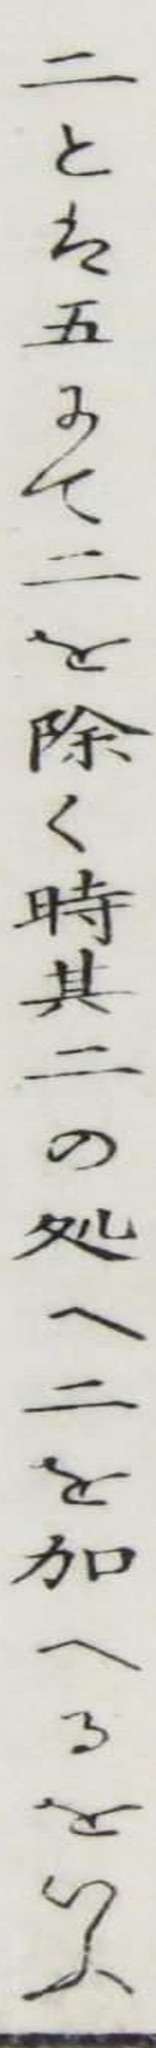二とは五にて二を除く時其二の処へ二を加へるをいふ
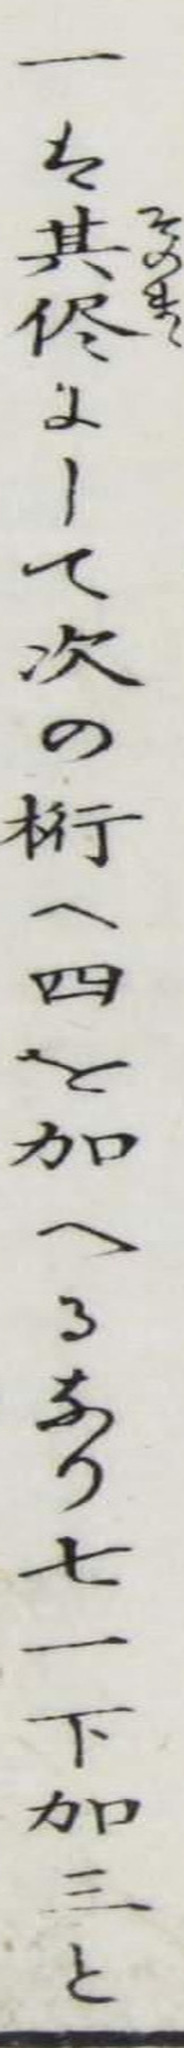一は其侭にして次の桁へ四を加へるなり七一下加三と

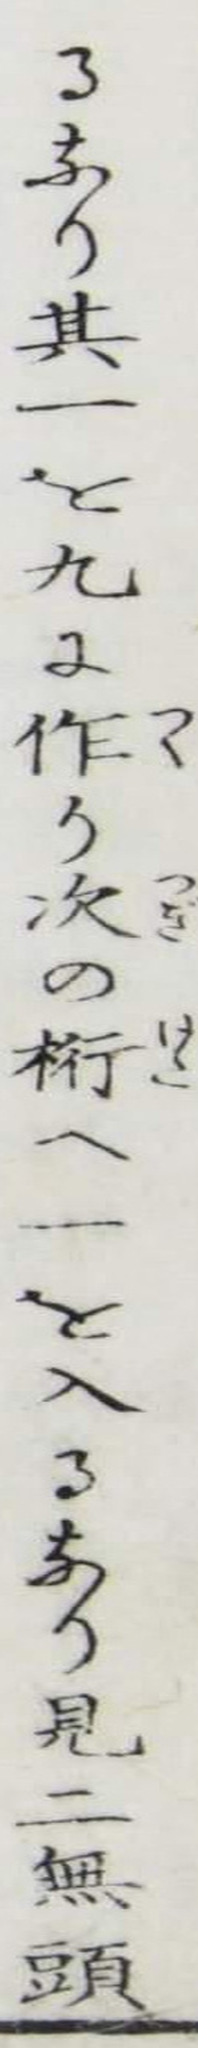るなり其一を九に作り次の桁へ一を入るなり見二無頭
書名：明治小學塵劫記 卷1
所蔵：東京学芸大学教育コンテンツアーカイブ
